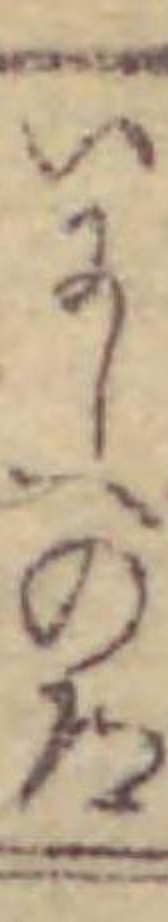いにしへの道
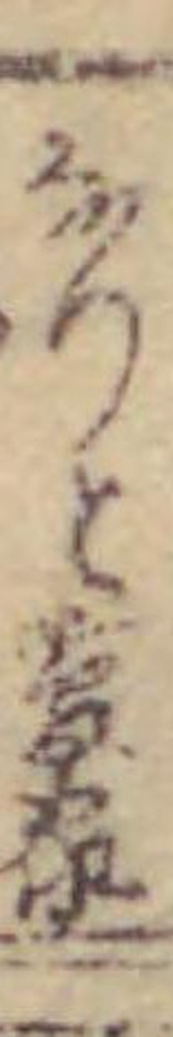なりと菅家
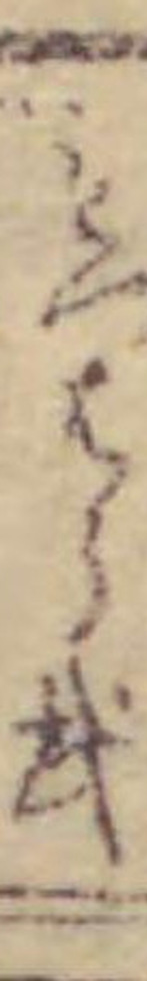もつはら武
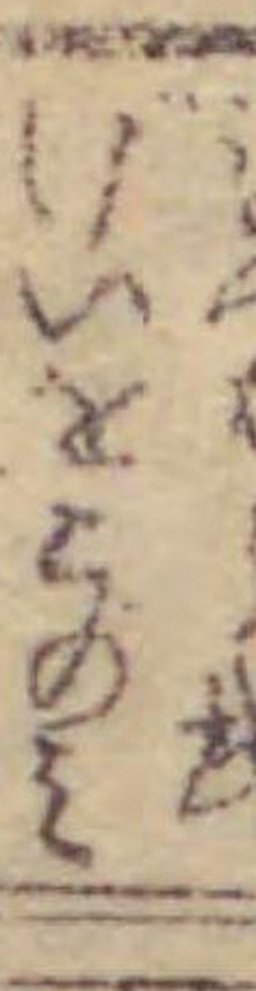けいをこのみ
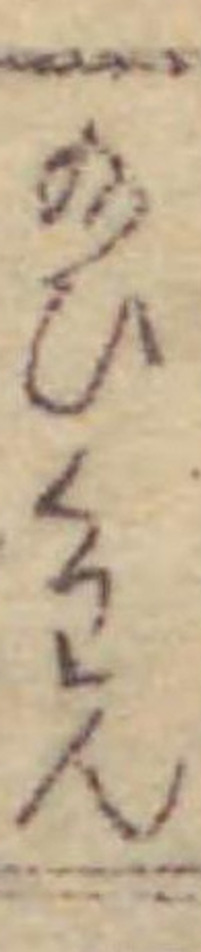給ひくわん
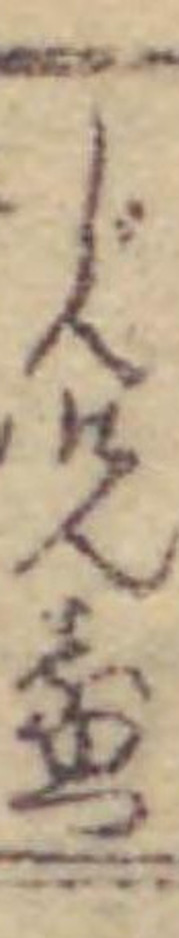じんけんしゆつ
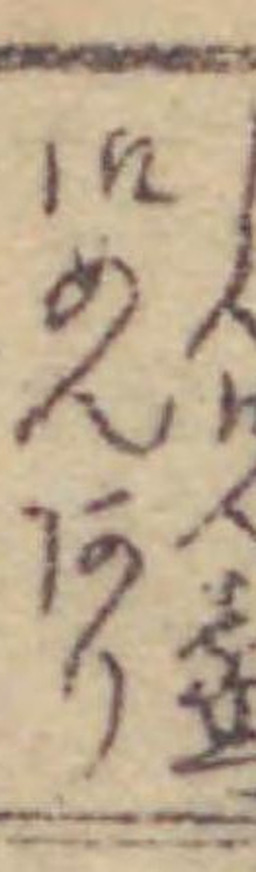御めんあり
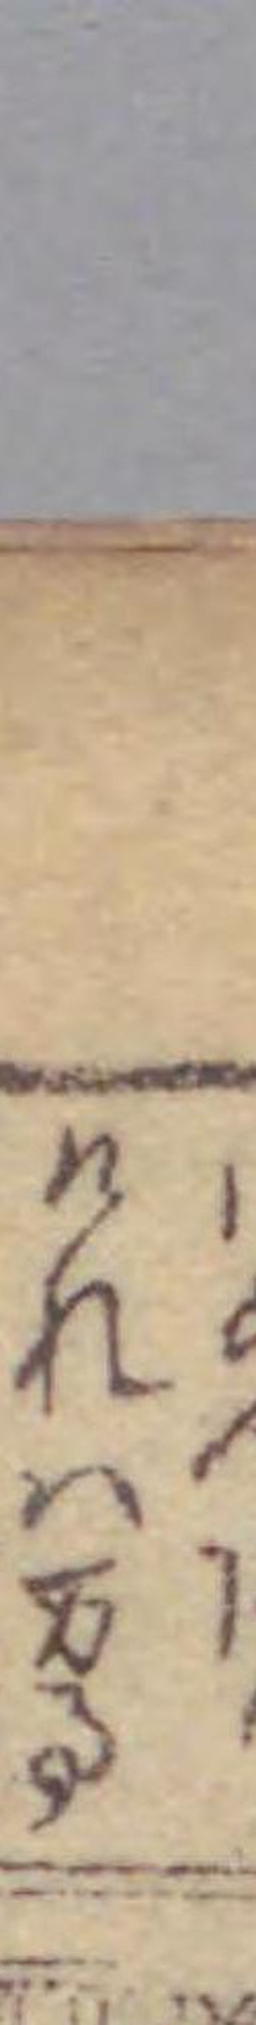けれは万事
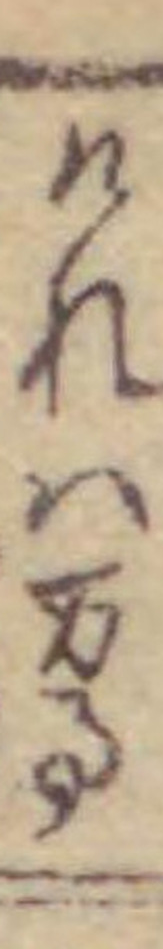けれは万事
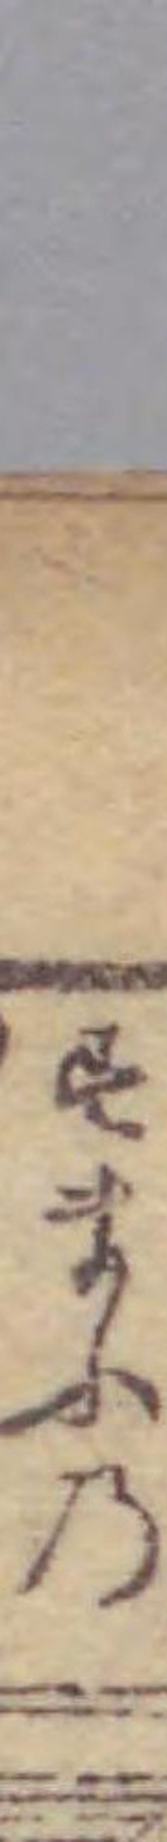すまふの
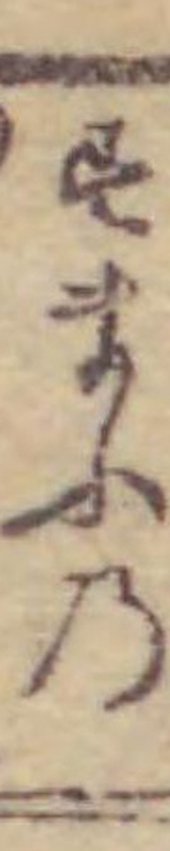すまふの
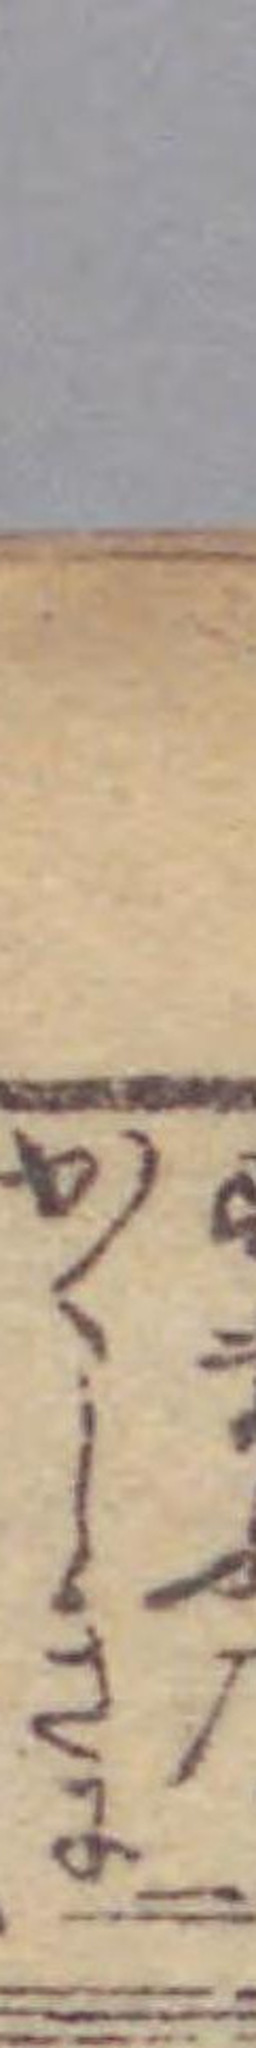かくしきに
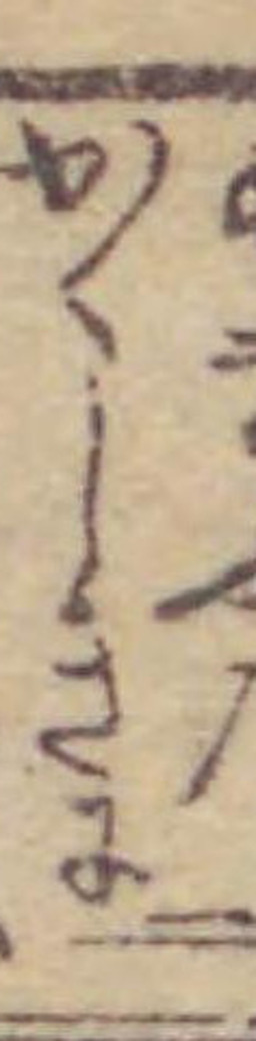かくしきに
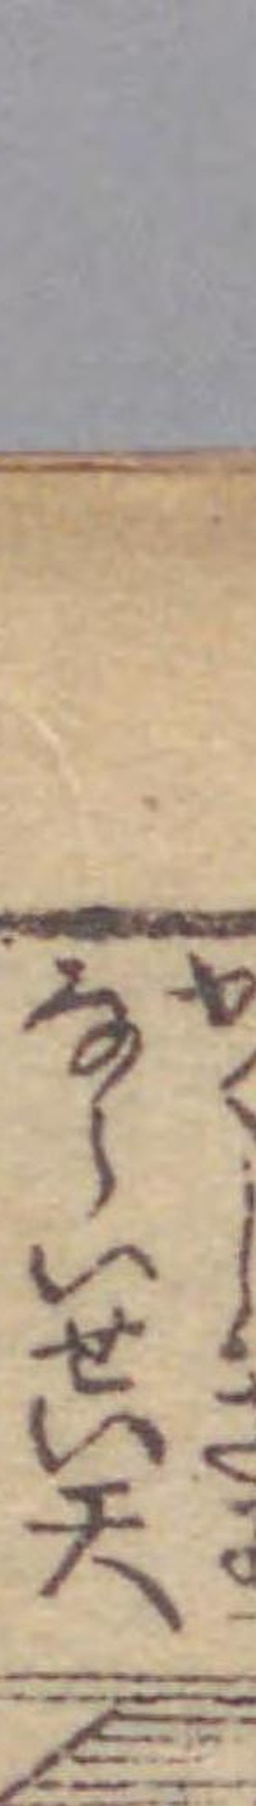ならいせい天
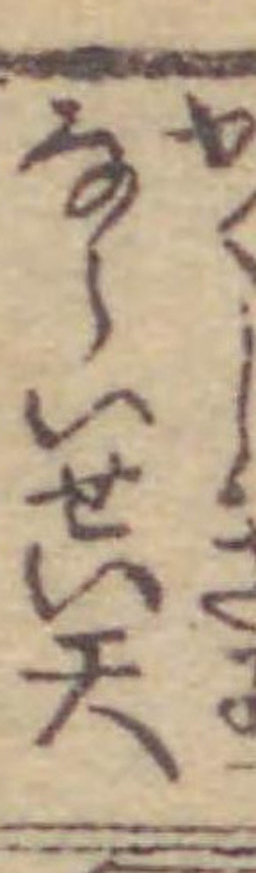ならいせい天
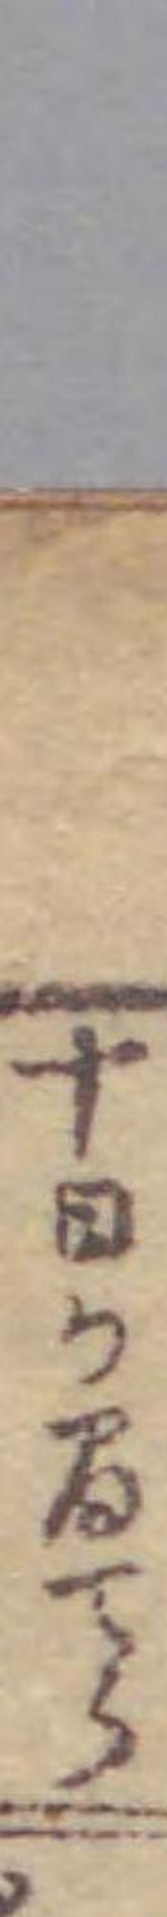十日か間てら
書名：天下一面鏡梅鉢 : 3巻
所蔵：国立国会図書館 National Diet Library, JAPAN
